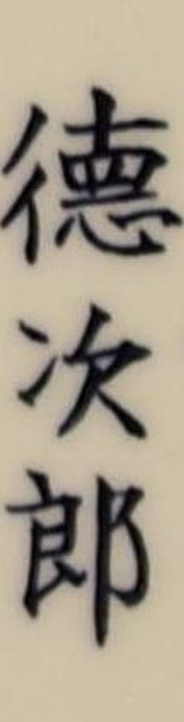徳次郎
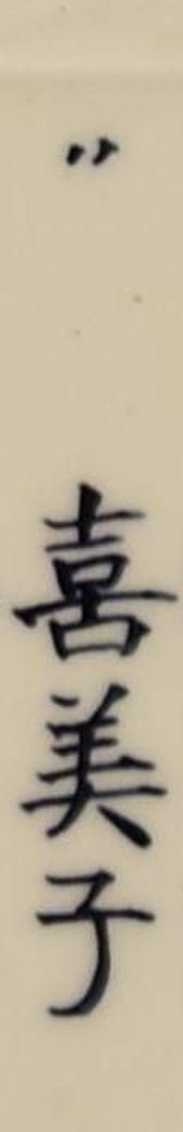喜美子
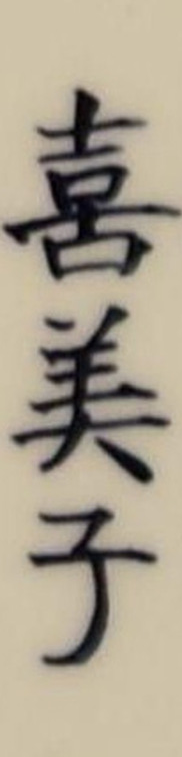喜美子
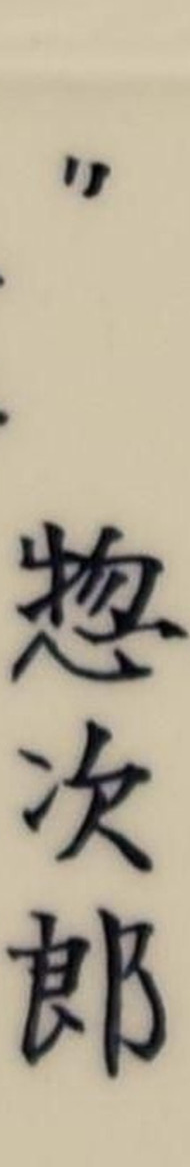惣次郎
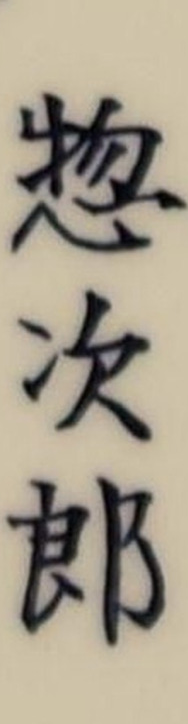惣次郎
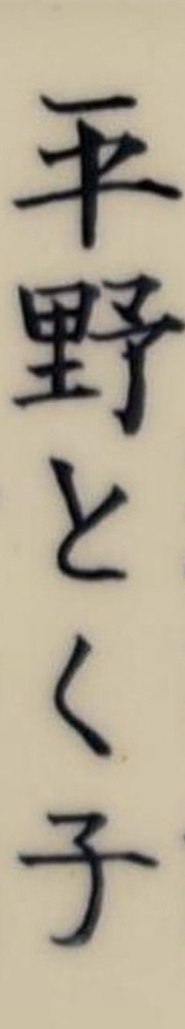平野とく子
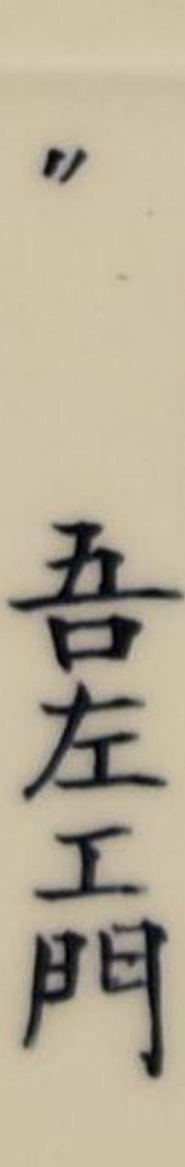吾左エ門
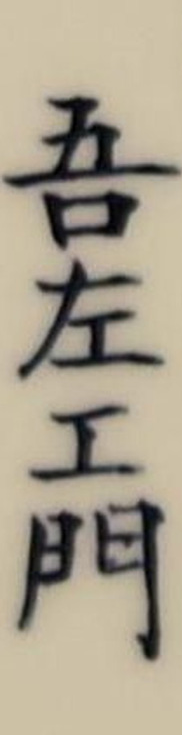吾左エ門
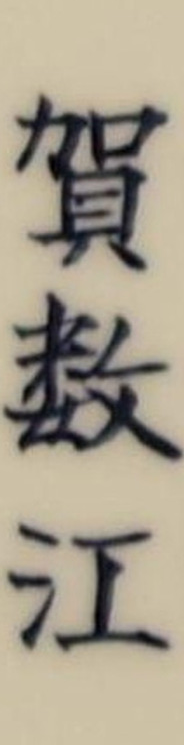賀数江
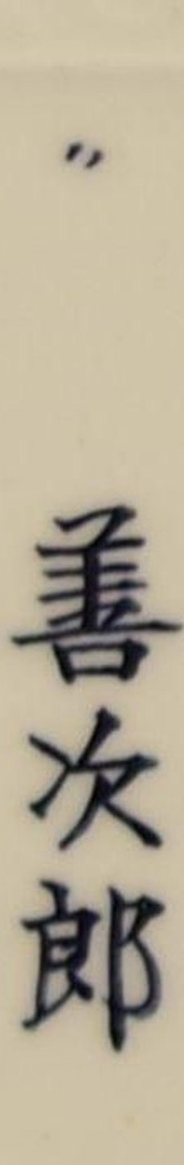善次郎
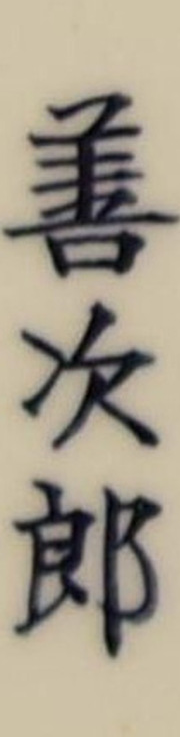善次郎
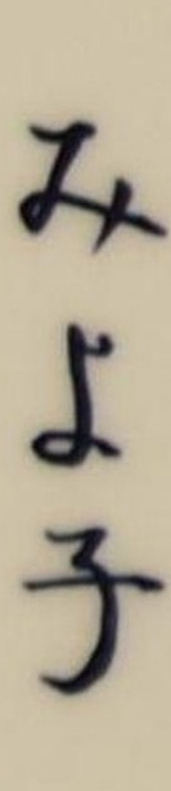みよ子
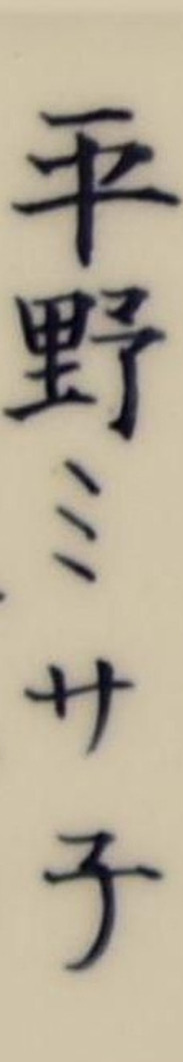平野ミサ子
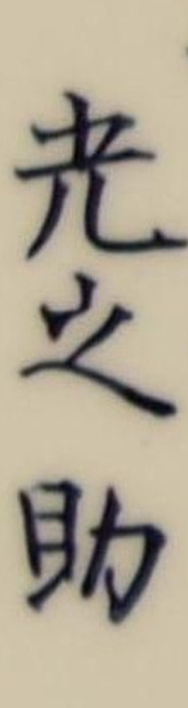光之助
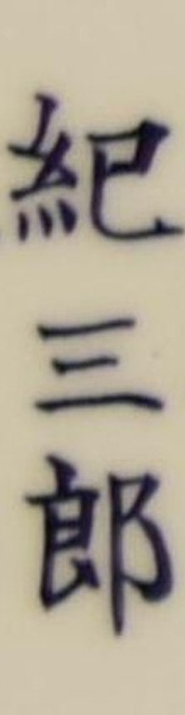紀三郎
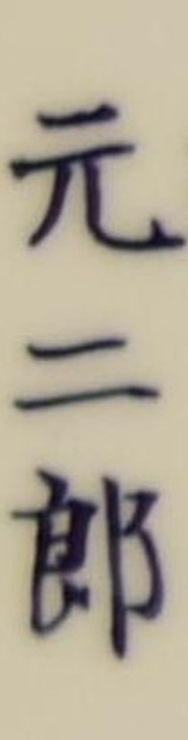元二郎
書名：A~D
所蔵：koyasan kongobuji
